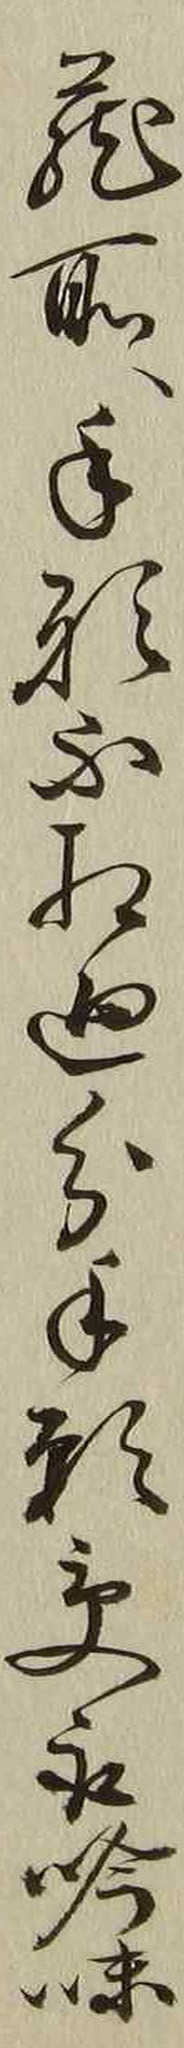蔵所へ手形不相廻分手形受取吟味
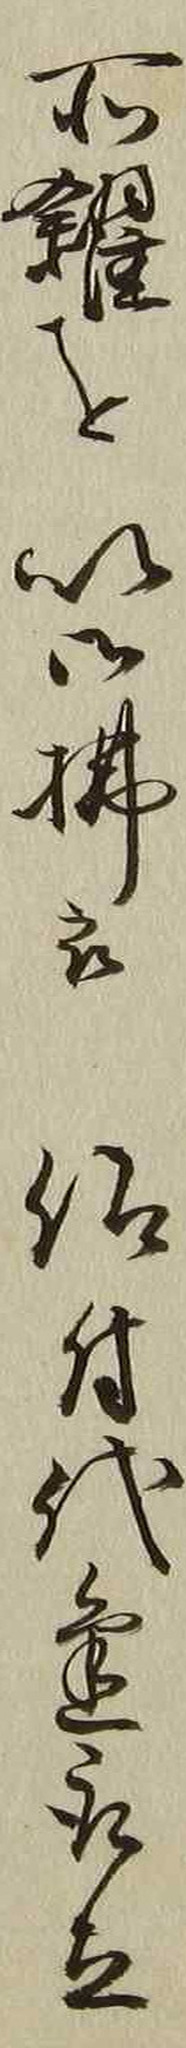所糴を以御払被仰付代金取立
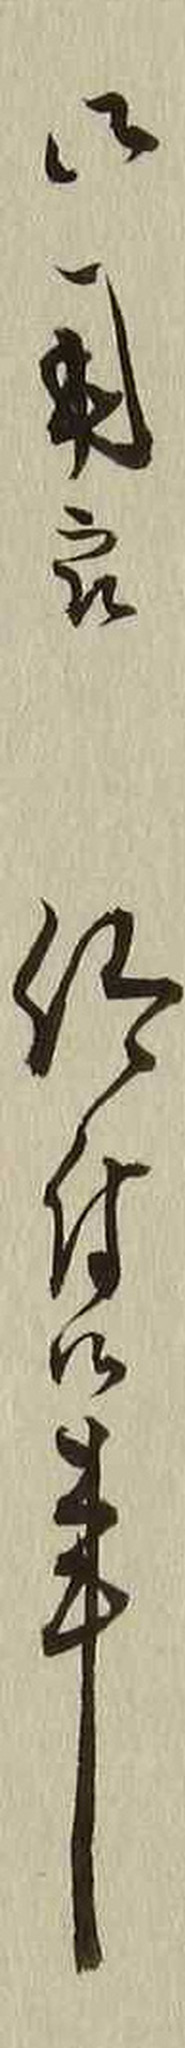御用被仰付候事
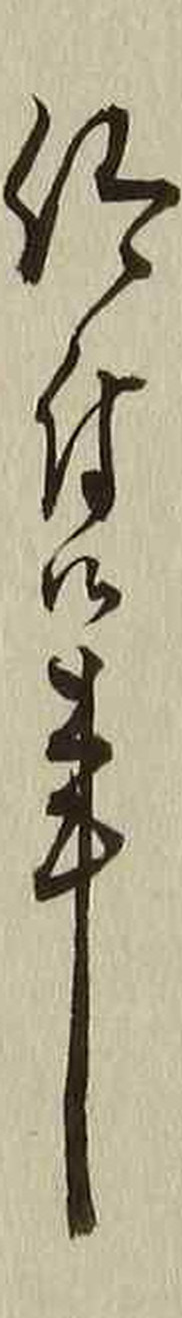仰付候事
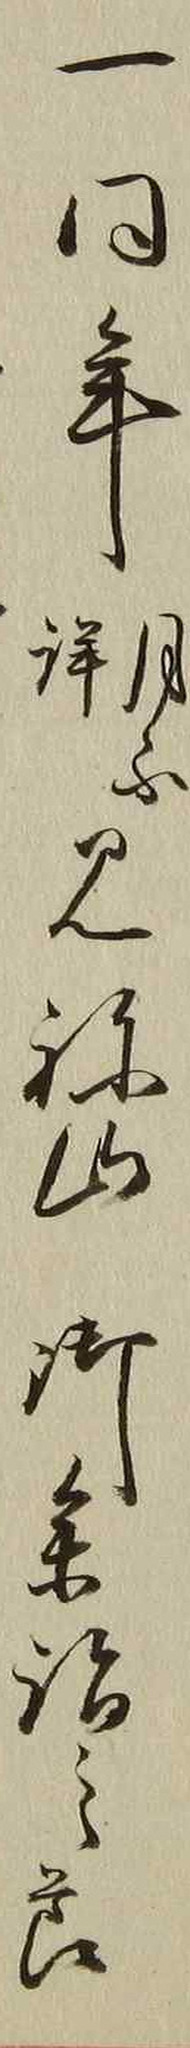一同年八月見祢山御参詣之節
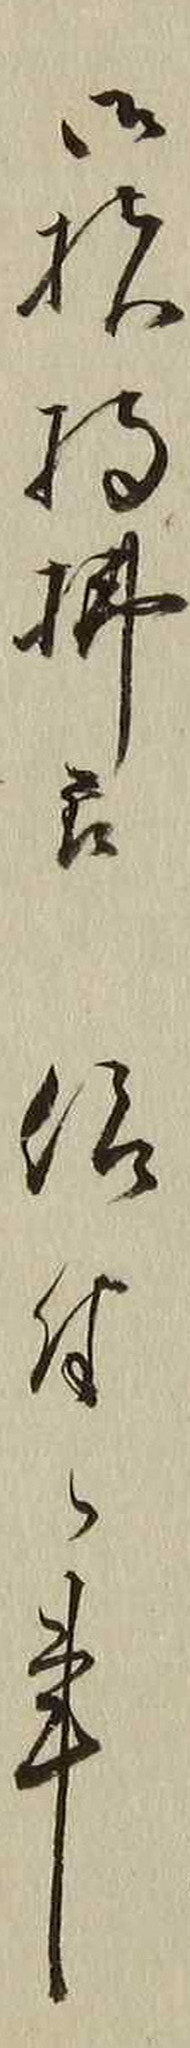御扶持払被仰付候事
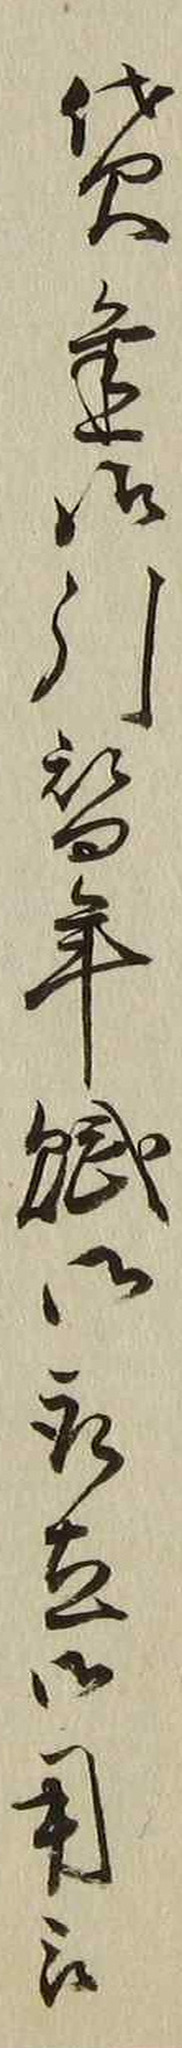貸金御引替年賦御取立御用被
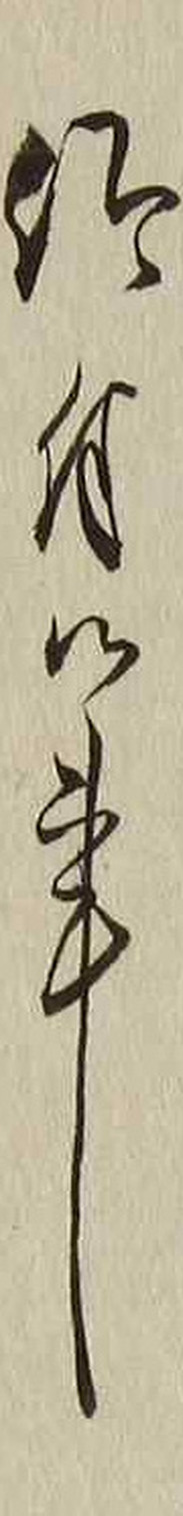仰付候事
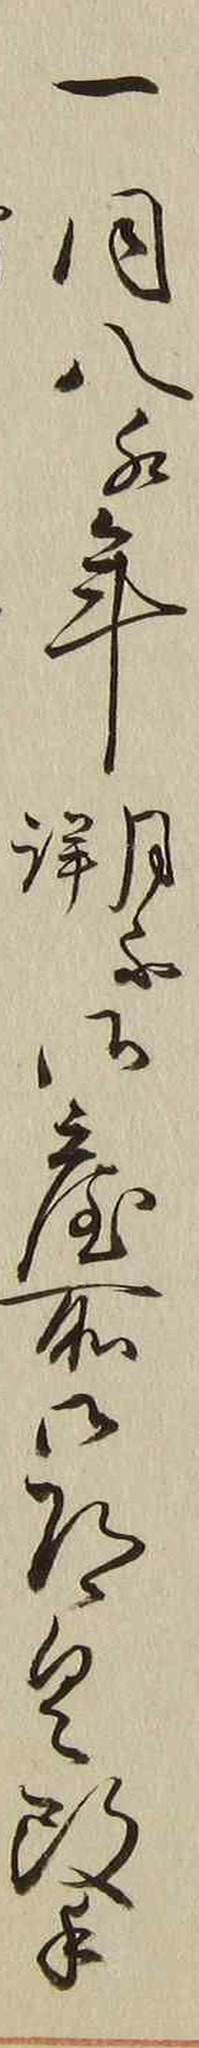一同八卯年月不詳御台所御道具改手
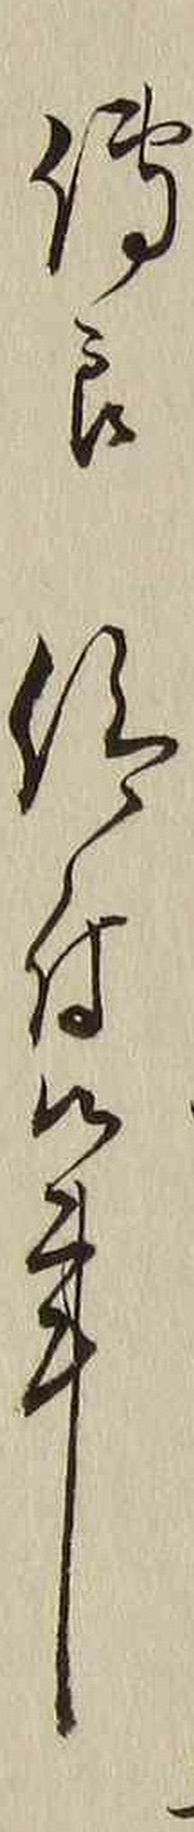伝被仰付候事
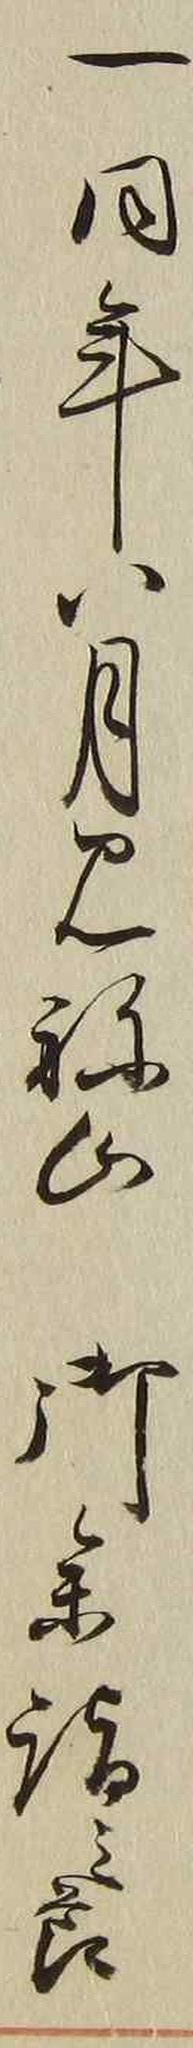一同年八月見祢山御参詣之節
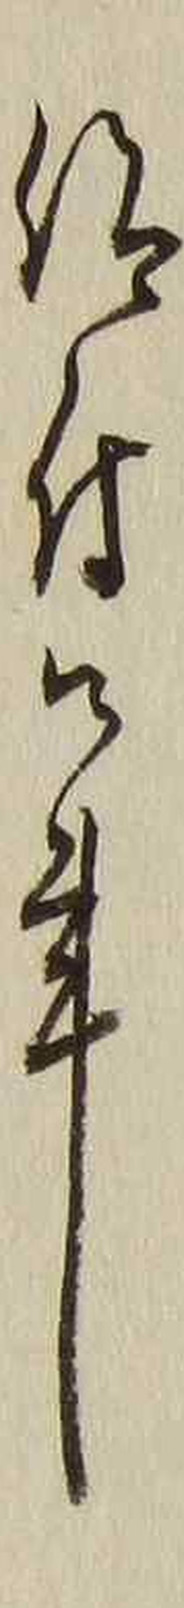仰付候事

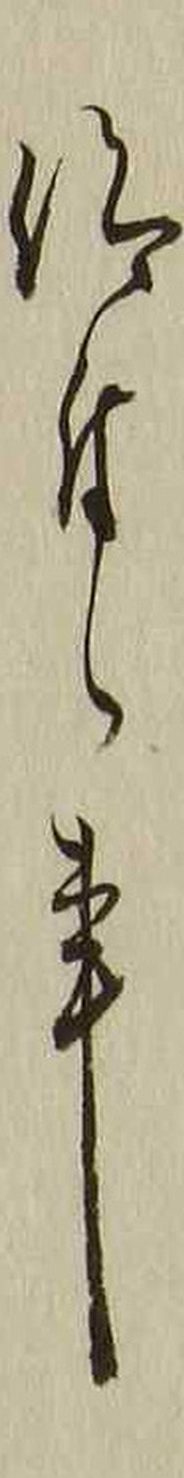仰付候事
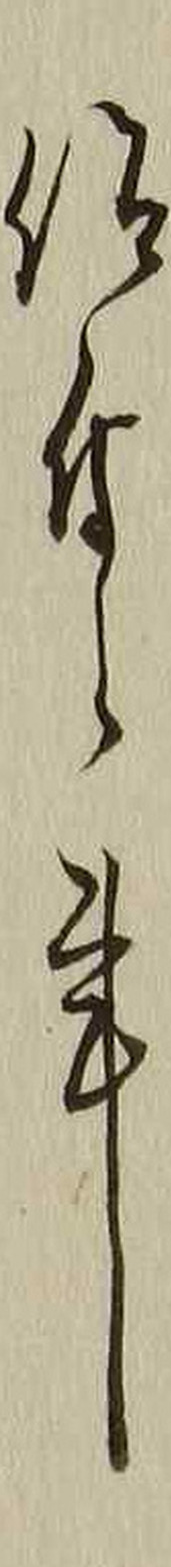仰付候事
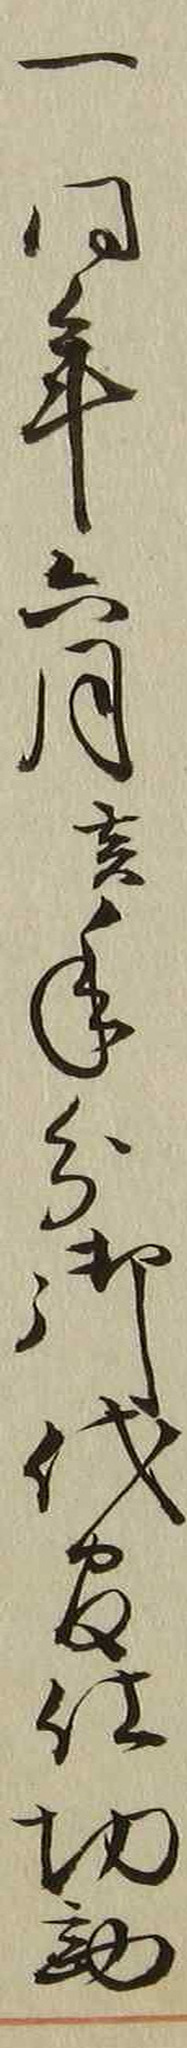一同年六月亥年分御代官仕切勘
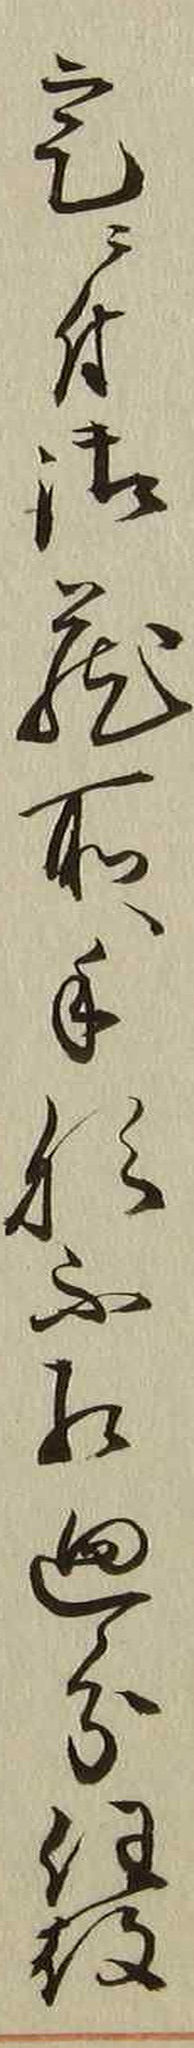定ニ付御蔵所へ手形不相廻分任役
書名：諸士系譜　巻之57　ほ之部4
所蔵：会津若松市立会津図書館
